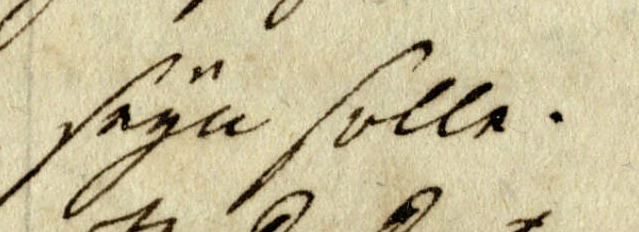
seÿn solle.
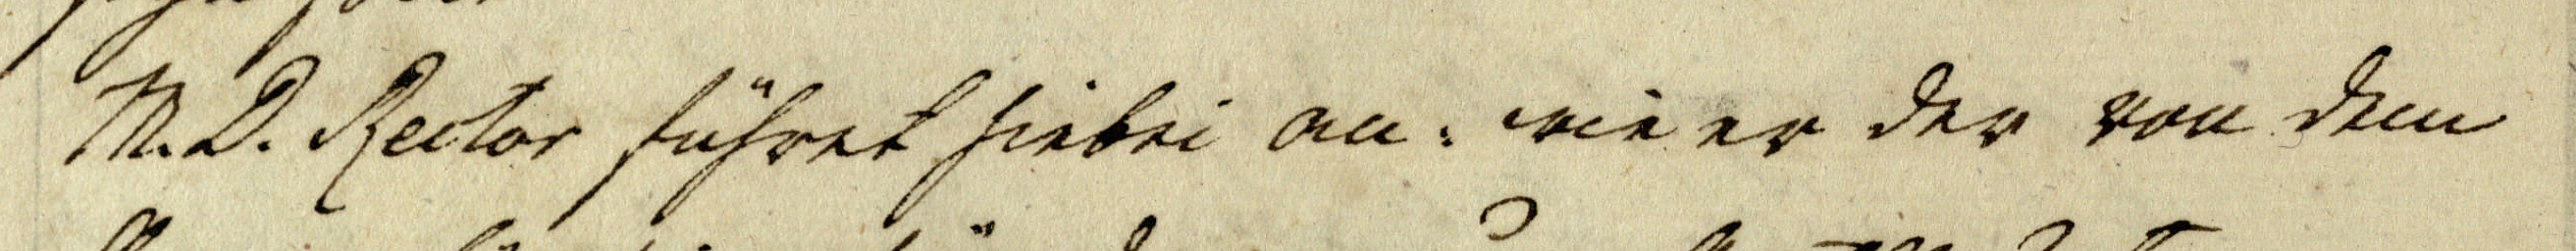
M. D. Rector führet hiebei an: wie er der von dem
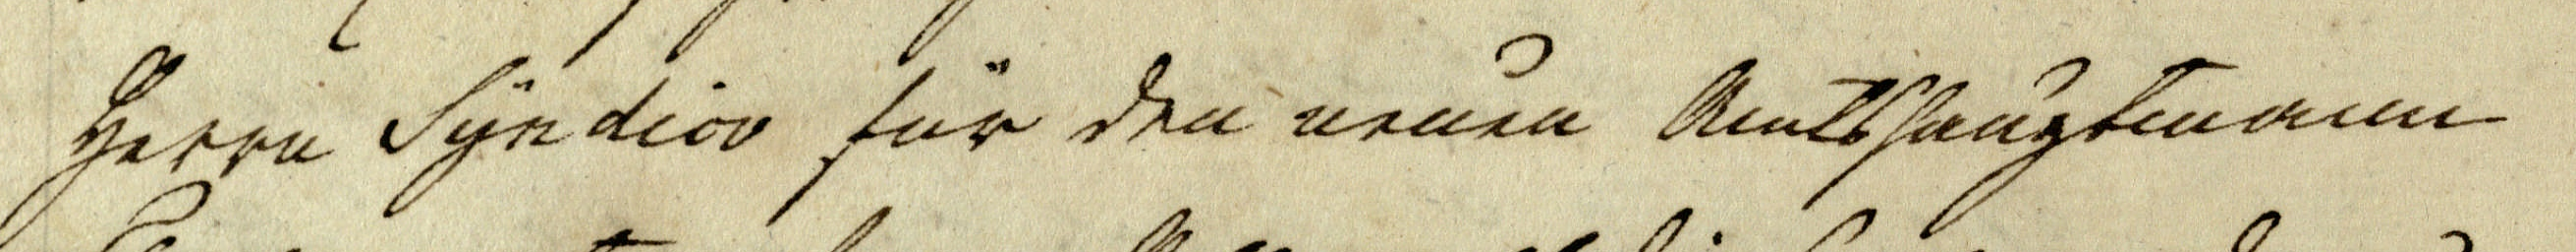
Herrn Sÿndico für den neuen Amtshauptmann
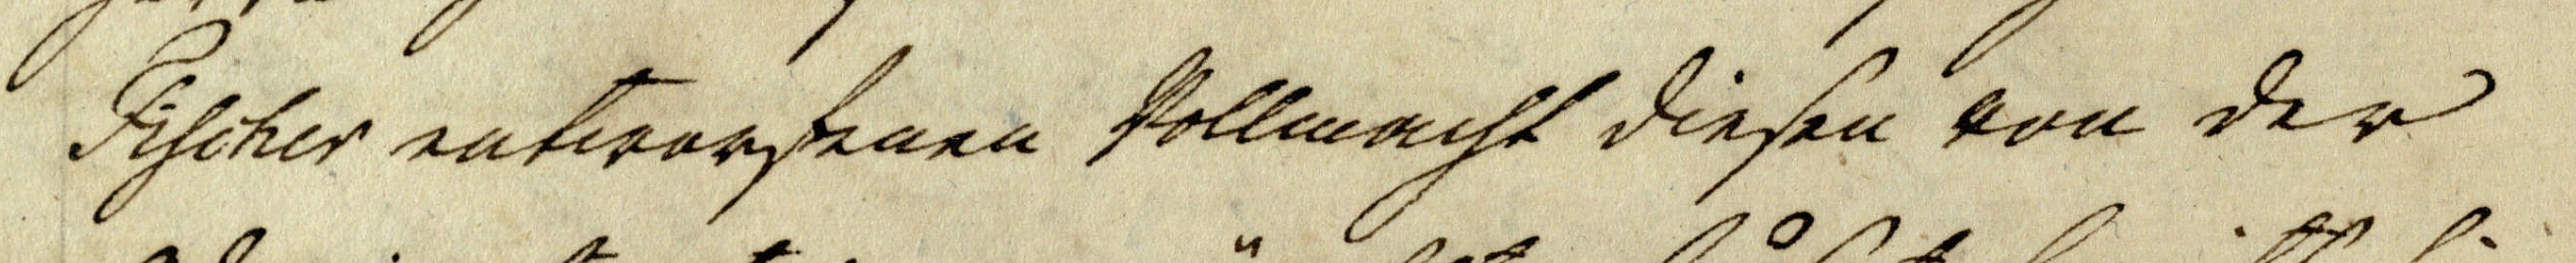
Fischer entworfenen Vollmacht diesen von der
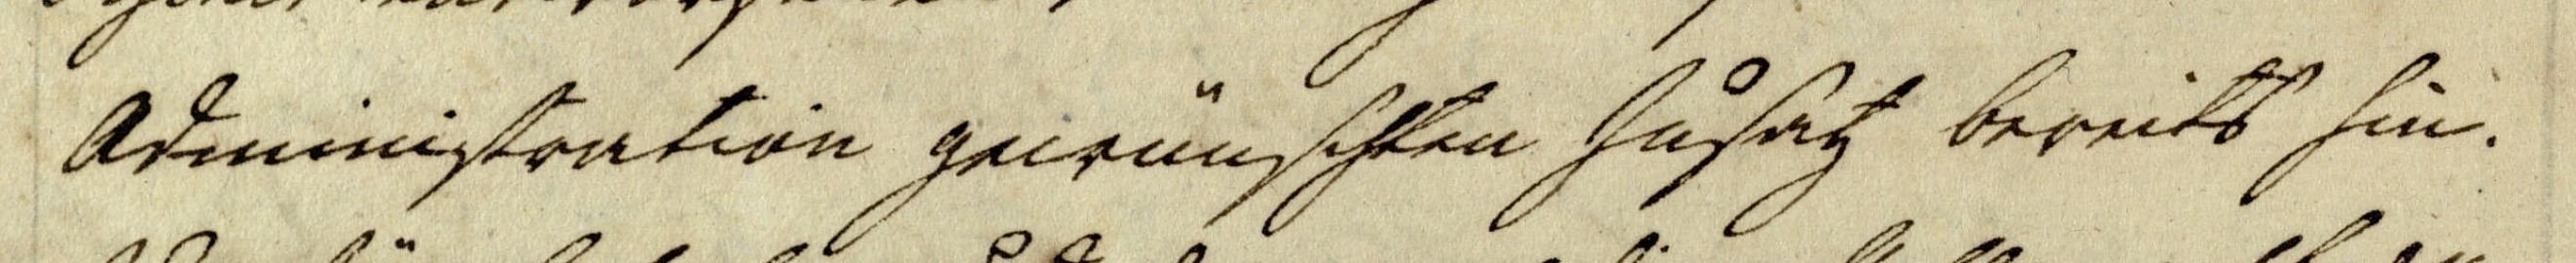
Administration gewünsichten Zusatz bereits hin¬
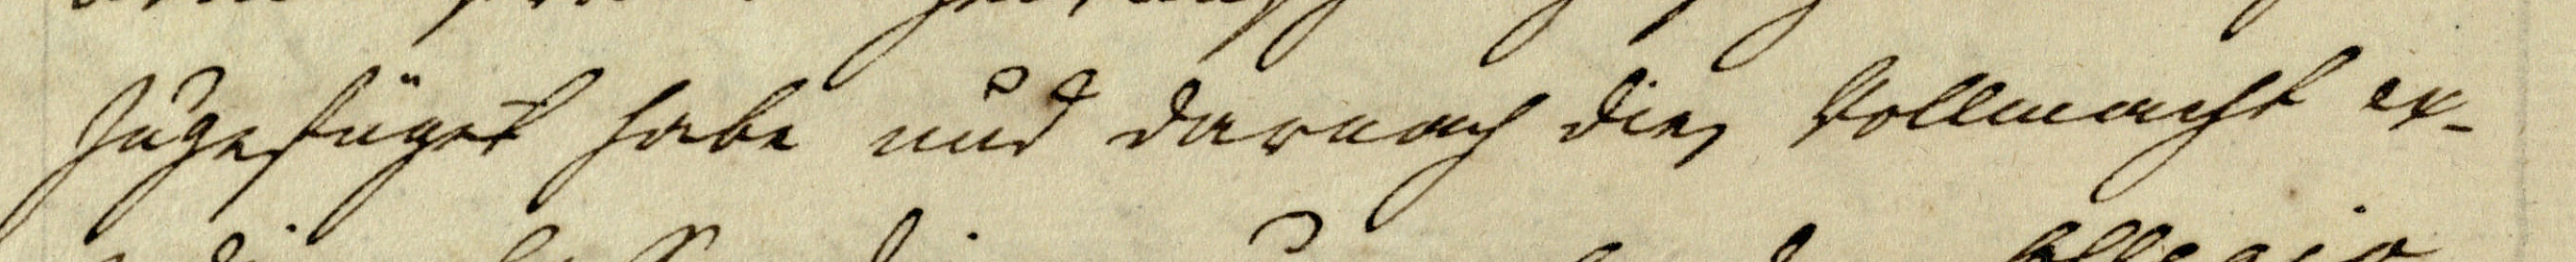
zugefüget habe und darnach die Vollmacht ex¬
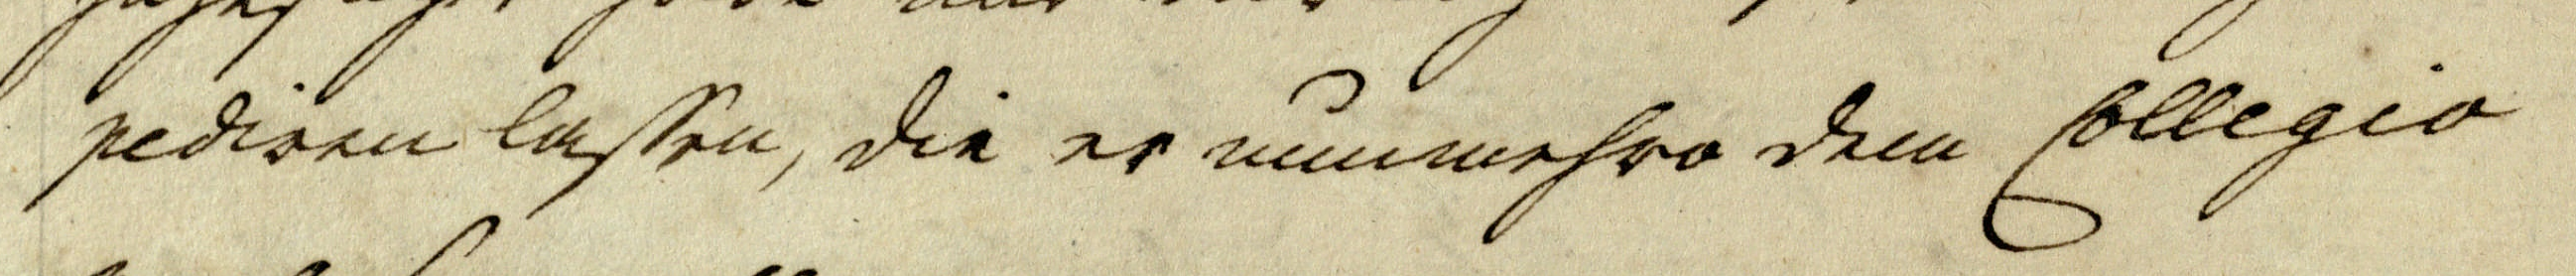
pediren lassen, die er nunmehro dem Collegio
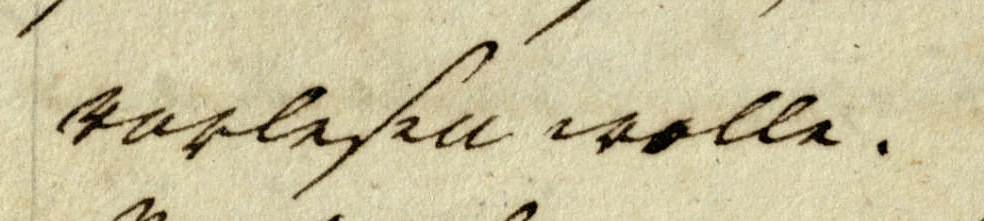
vorlesen wolle.
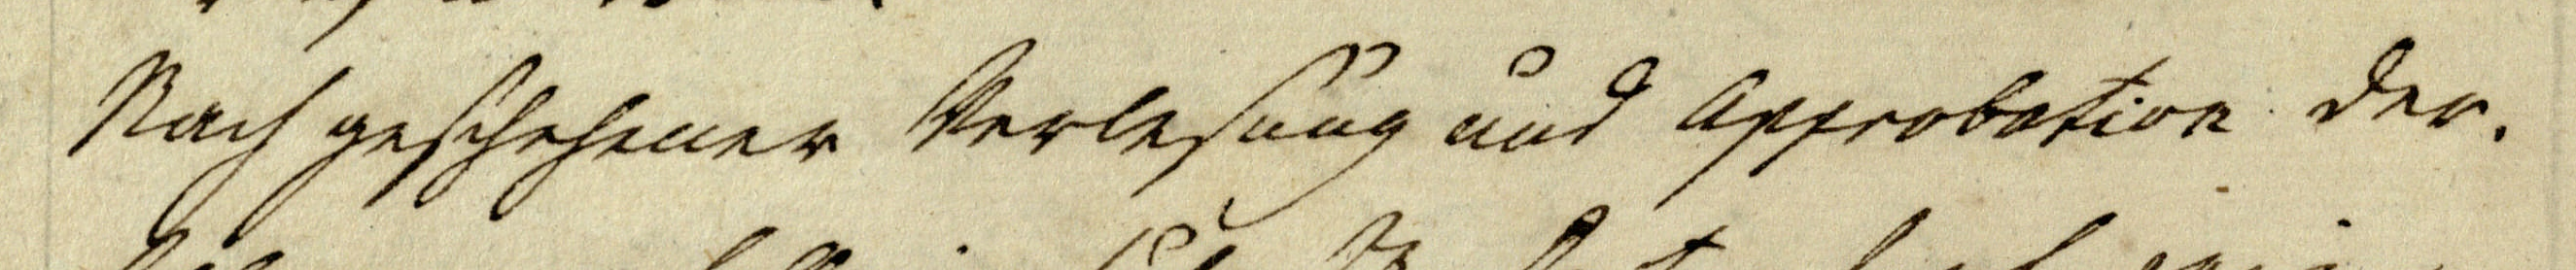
Nach geschehener Verlesung und Approbation der¬
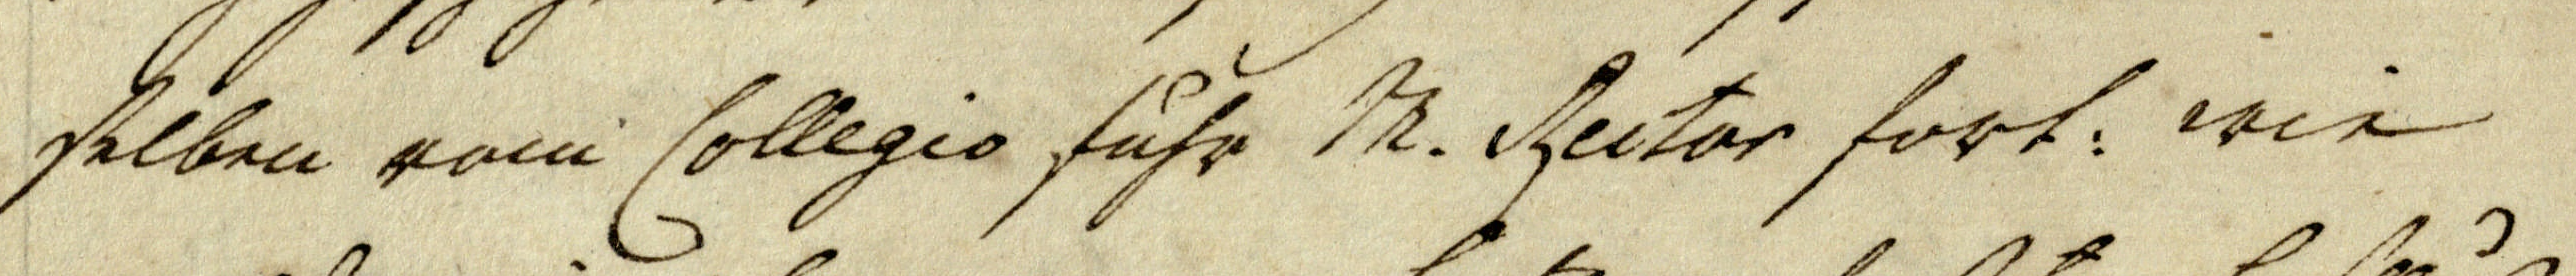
selben vom Collegio für M. Rector fort: wie
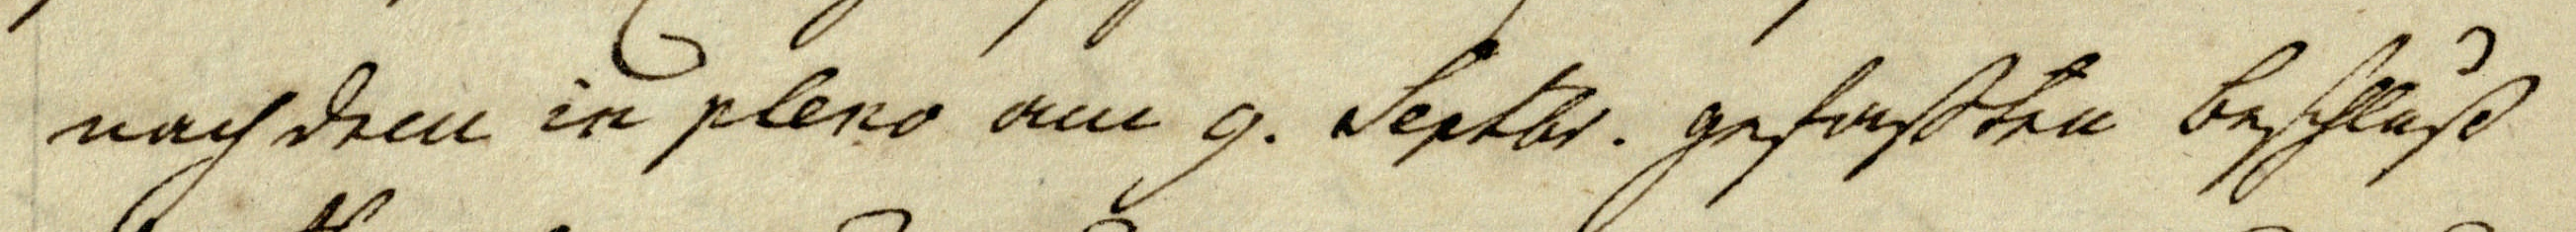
nach dem in pleno am 9. Septbr. gefaßten Beschluß
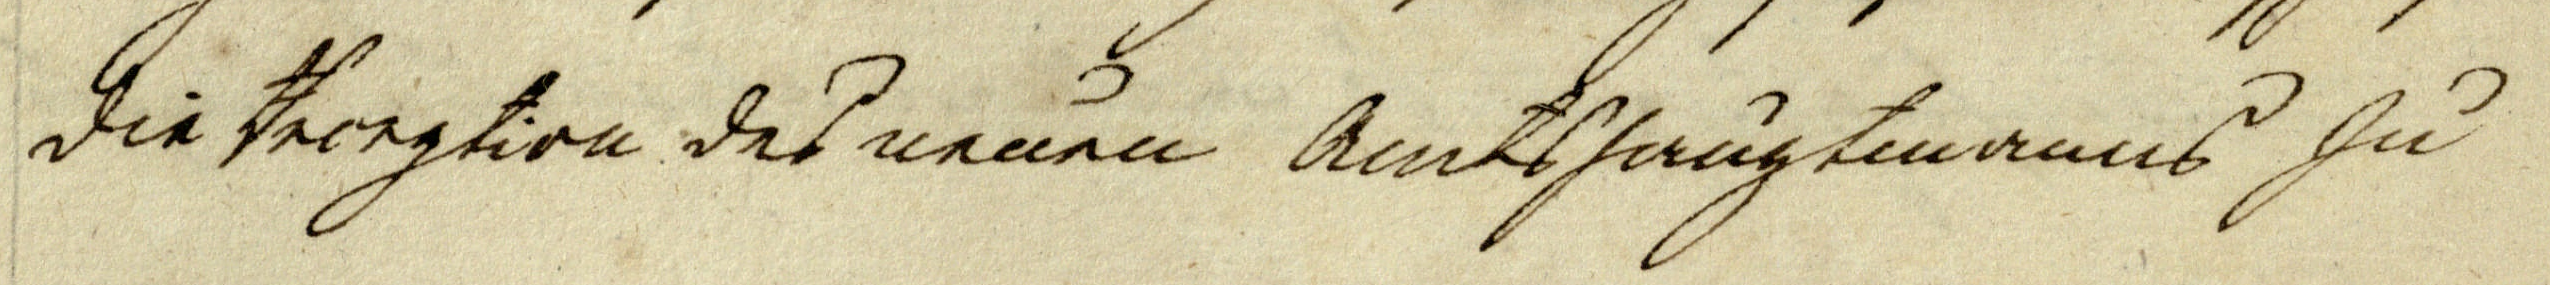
die Reception des neuen Amtshauptmanns zu
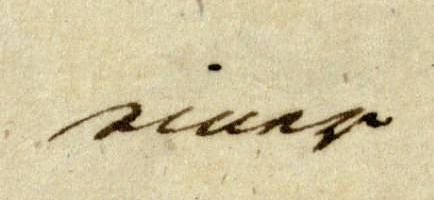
einer
